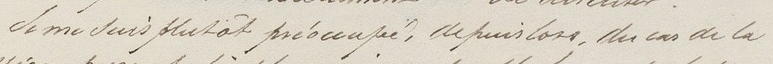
Je me suis plutôt préoccupé, depuis lors, du cas de la
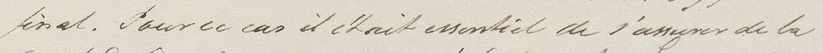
final. Pour ce cas il était essentiel de s'assurer de la
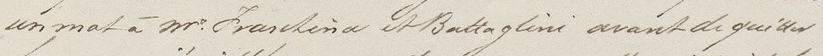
un mot à MrsFraschina et Battaglini avant de quitter
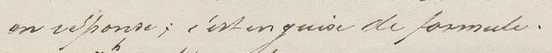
en réponse; c'est en guise de formule.
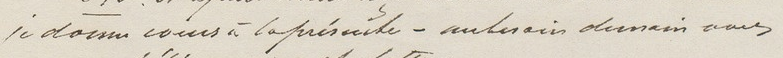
je donne cours à la préscrite – au besoin demain vous
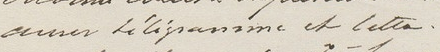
aurez télégramme et lettre.
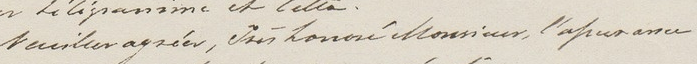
Veuillez agréer, Très honoré Monsieur, l'assurance
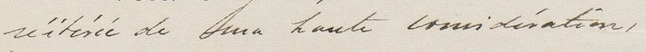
réitérée de ma haute considération,
